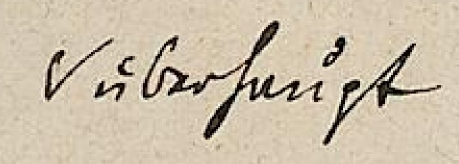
V überhaupt
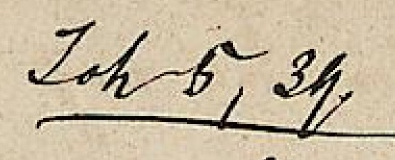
Joh 5,39.
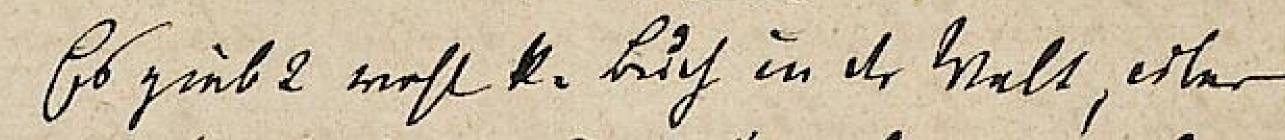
Es giebt wohl k. Buch in dr Welt, über
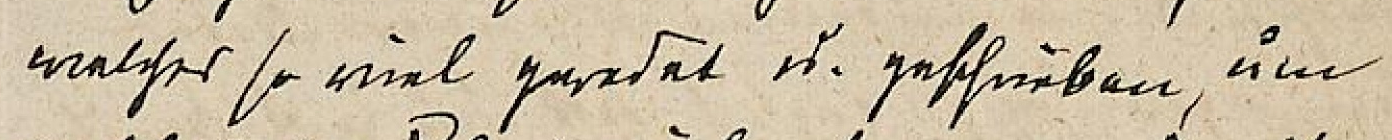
welches so viel geredet u. geschrieben, um
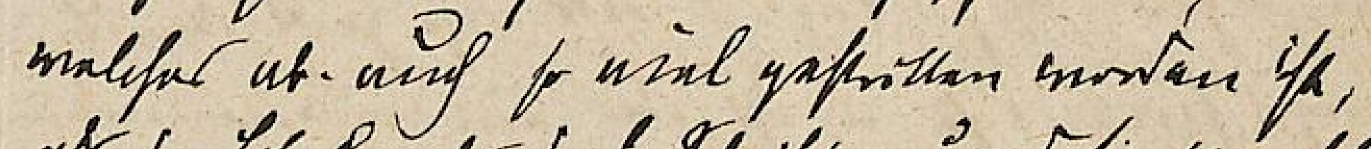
welches ab. auch so viel gestritten worden ist,
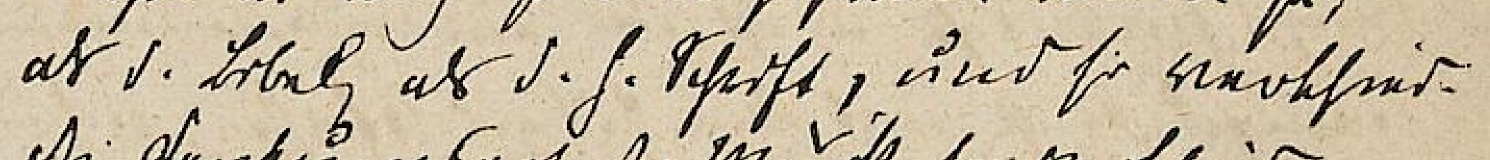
as d. Bibel, als d. H. Schrift, und so verschied.
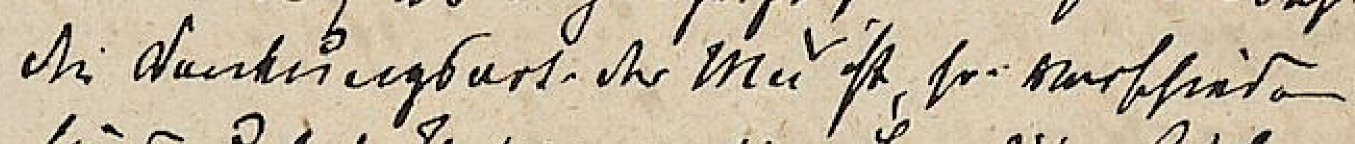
die Denkungsart der Mn ist, so verschieden
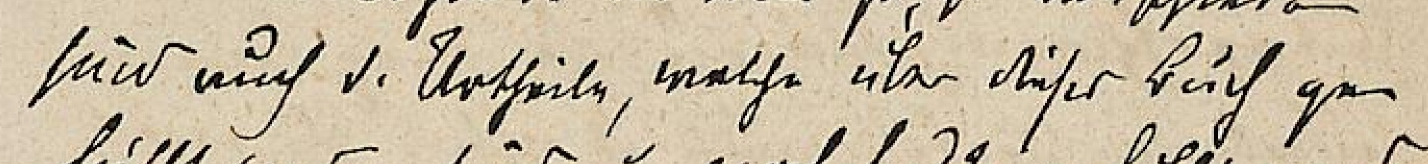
sind auch d. Urtheil welche über dieser Buch ge¬
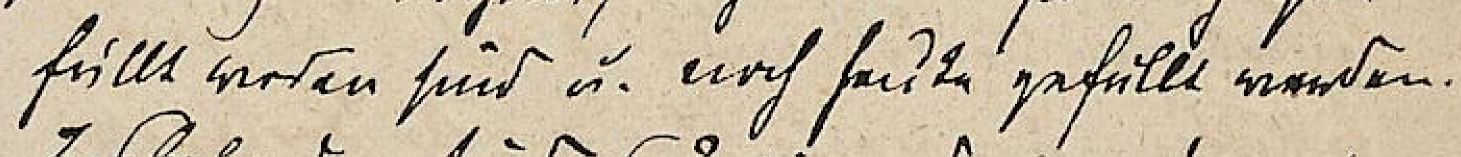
fällt worden sind u. noch heute gefällt werden.
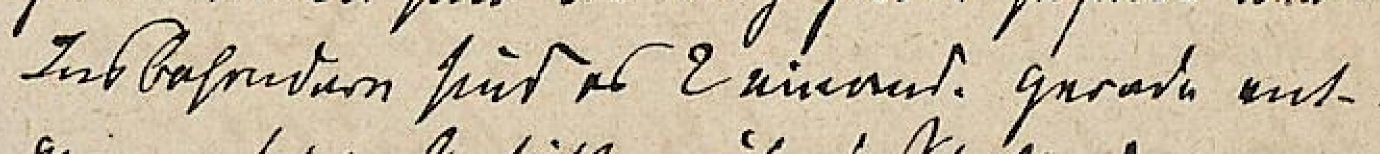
Insbeondern sind es 2 einand. gerande ent¬
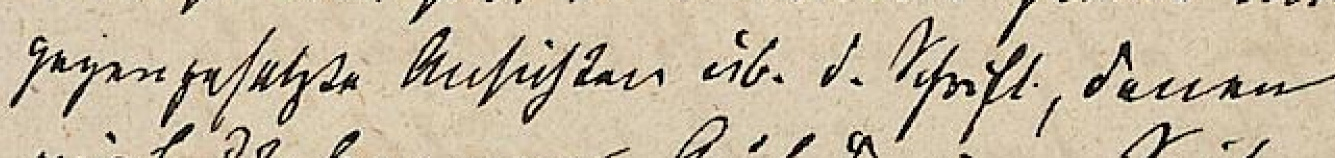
gegengesetzte Ansichten üb. d. Schrift, denen
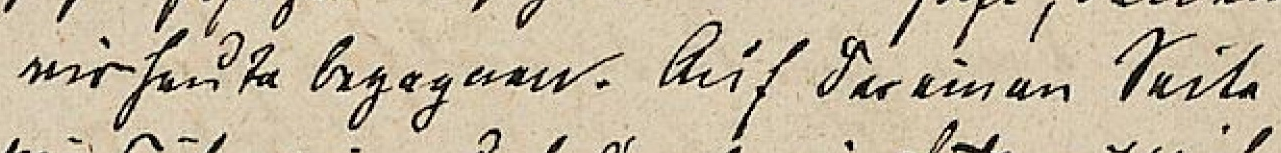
wir heute begegenen. Auf der einen Seite
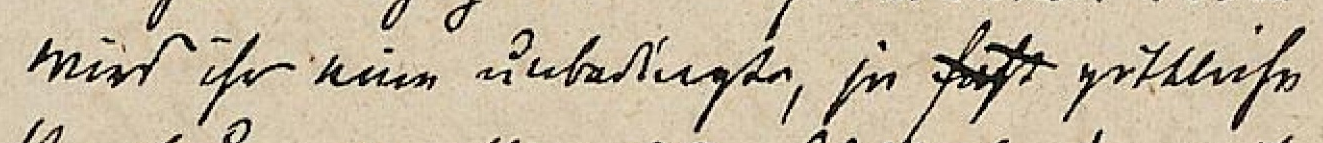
wird ihr eine unbedingte, jn fast göttliche
